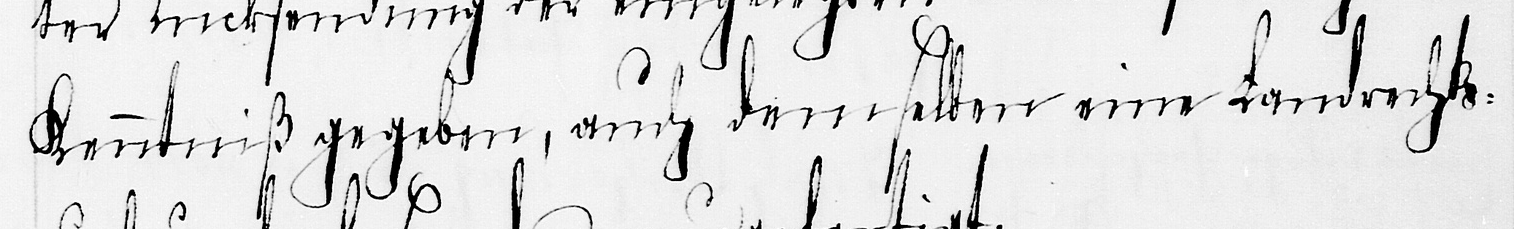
Kenntniß gegeben, auch demselben eine Landrechts¬
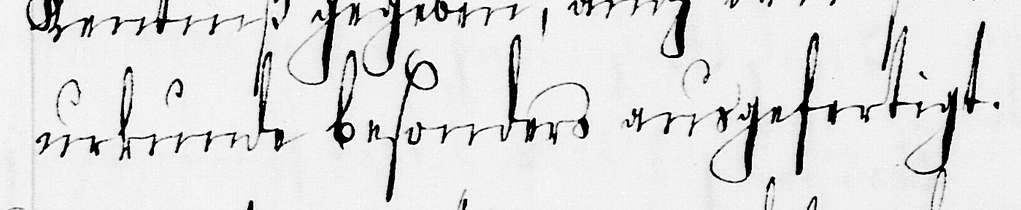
urkunde besonders ausgefertigt.
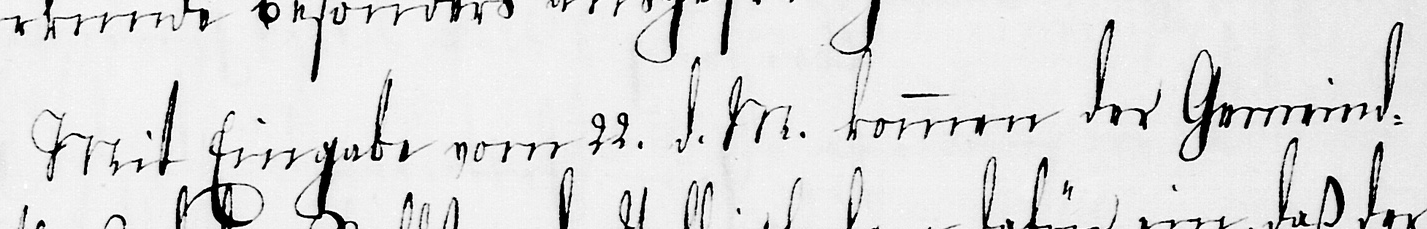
Mit Eingabe vom 22. d. M. kommen der Gemeind¬
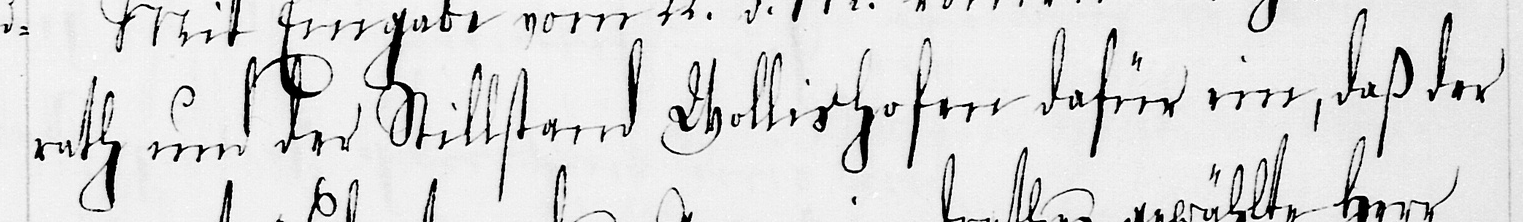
rath und der Stillstand Wollishofen dafür ein, daß der
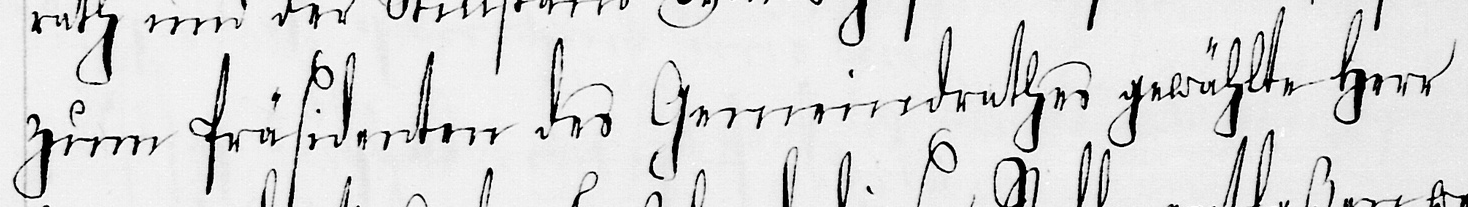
zum Präsidenten des Gemeindrathes gewählte Herr
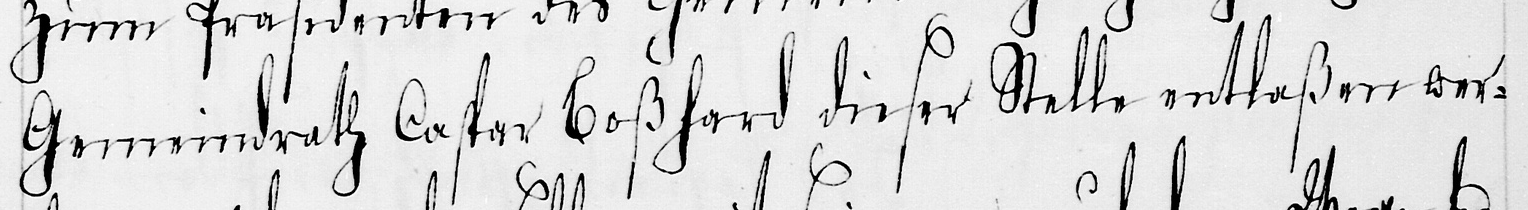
Gemeindrath Caspar Boßhard dieser Stelle entlaßen wer¬
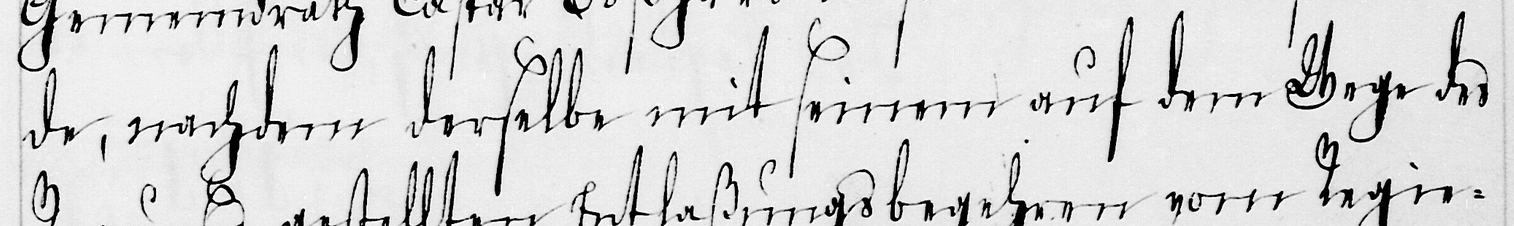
de, nachdem derselbe mit seinem auf dem Wege des
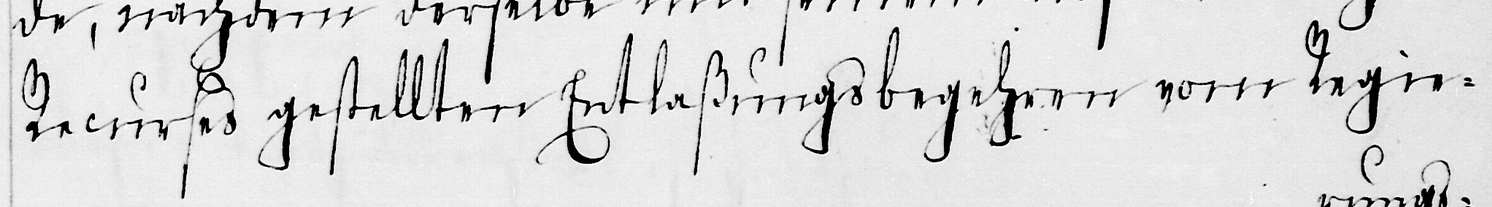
Recurses gestellten Entlaßungsbegehren vom Regie-
